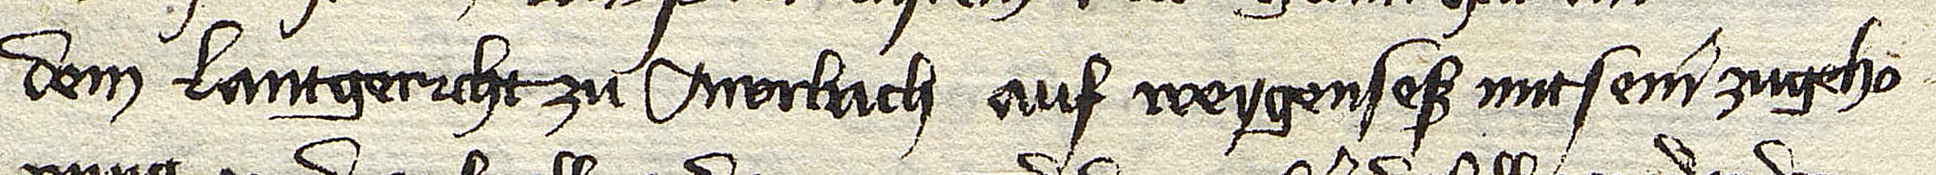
dem lantgericht ʒu Awrbach auf weygenſeſʒ mit ſein* ʒugehö =
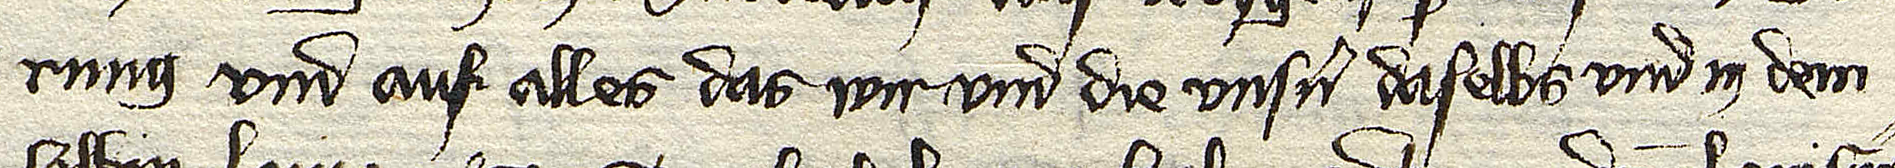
rung vnd auf alles das wir vnd die vnſ*n daſelbs vnd in dem
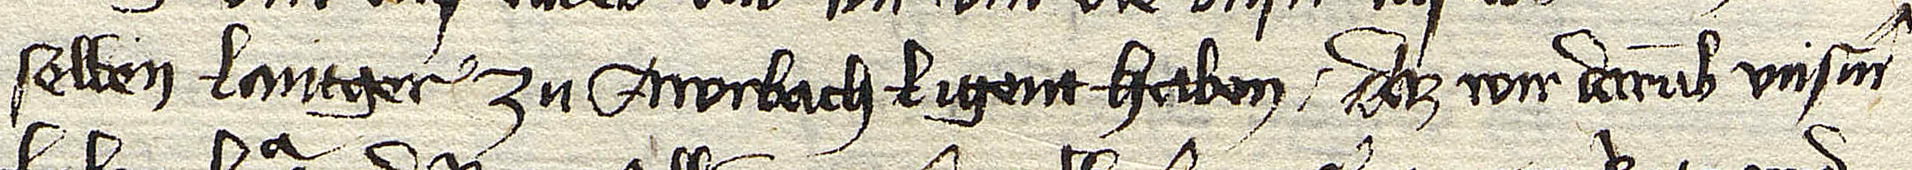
ſelben lantger* ʒu Awrbach ligent haben / daʒ wir darub* vnſ*m
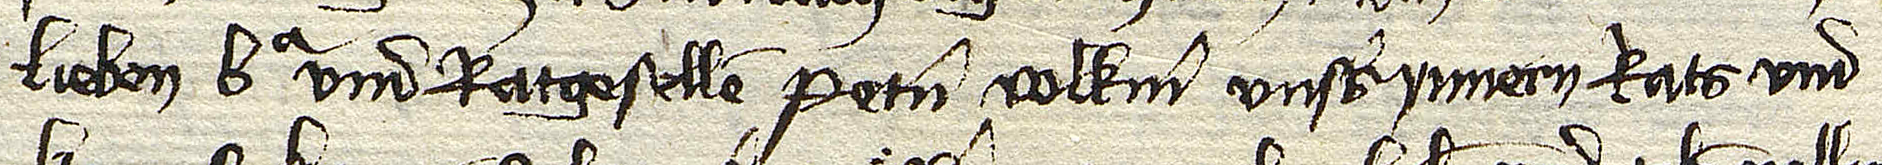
lieben b* vnd Ratgeſelle* Petn* volkm* vnſs* ynnern Rats vnd
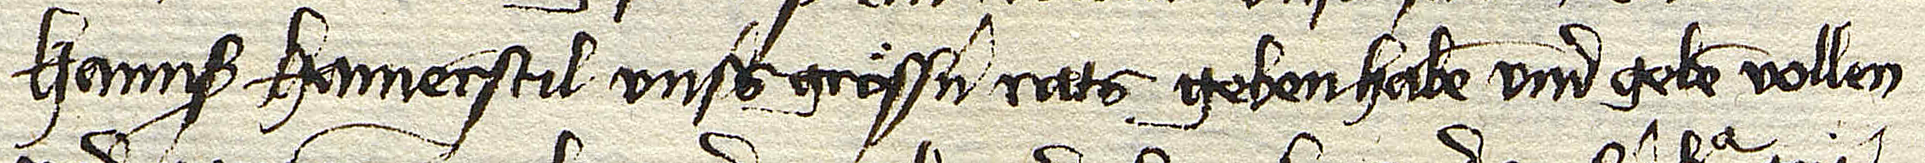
Hannſ* Hamerſtil vnſs* gröſſn* rats geben habe* vnd gebe* vollen
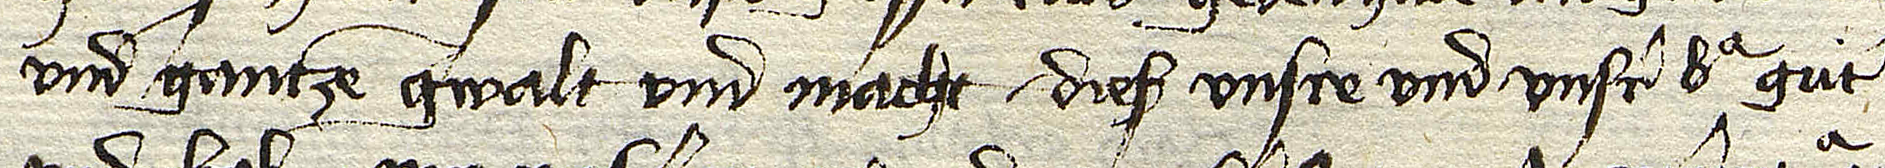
vnd gancʒe* gwalt vnd macht / dieſ* vnſre vnd vnſr* b* güt*
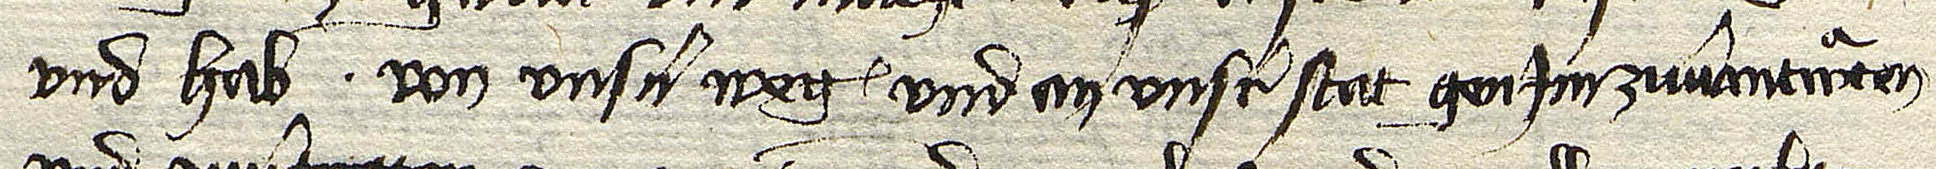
vnd hab . von vnſn* weg* vnd an vnſr* ſtat gen Im ʒuu*antw*ten
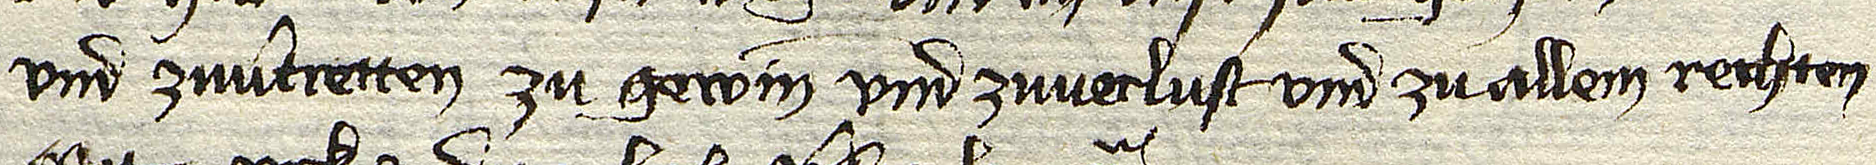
vnd ʒuu*tretten ʒu gewin* vnd ʒuuerluſt vnd ʒu allem rechten
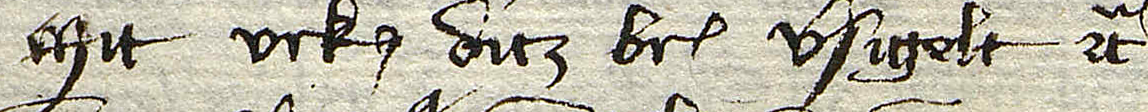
Mit vrk* dicʒ br* v*ſigelt ec*
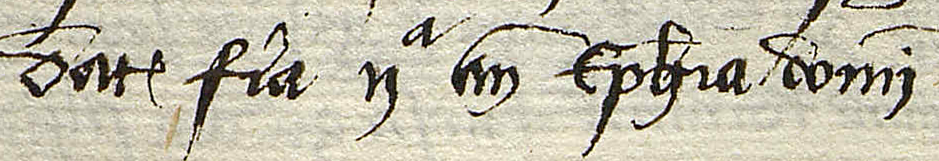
Dat* f*ia ii* an* Ephia* domi*
